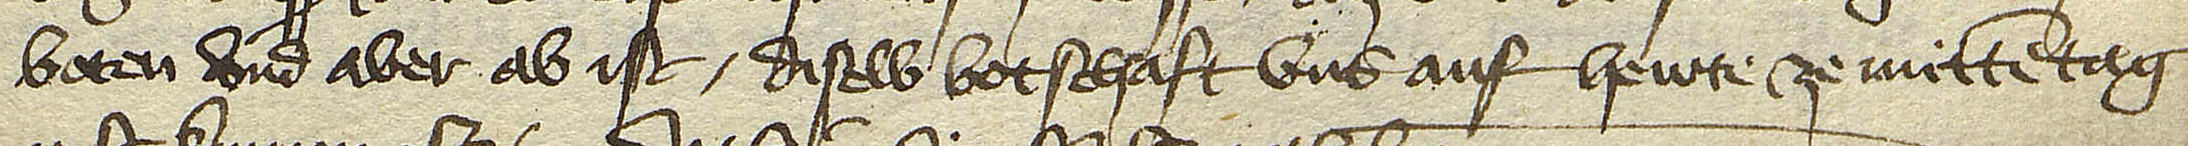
boten vnd aber ab iſt / diſelb botſchaft vns auf hewte cʒe mitte*tag
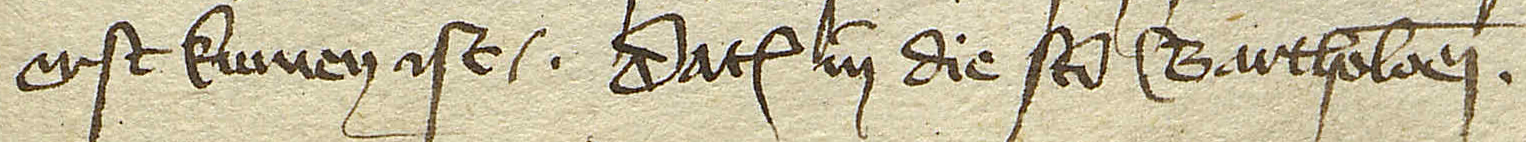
erſt kumen iſt / . Dat* iii* die ſci* Bartholoei* .
